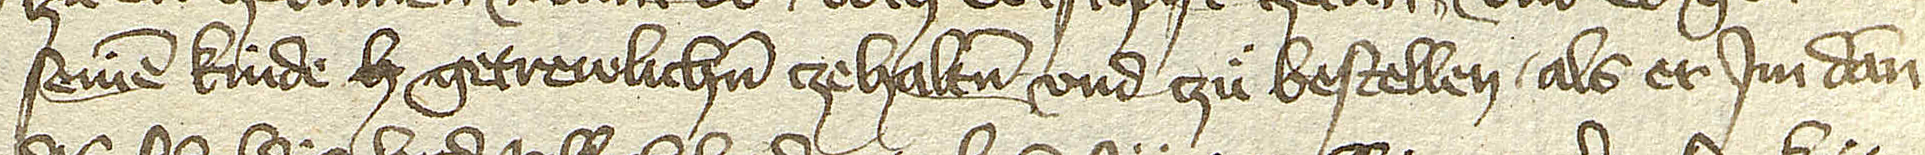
ſeine* kinde h getrewlichn* cʒehaltn* vnd cʒü beſtellen / als er Im dan*
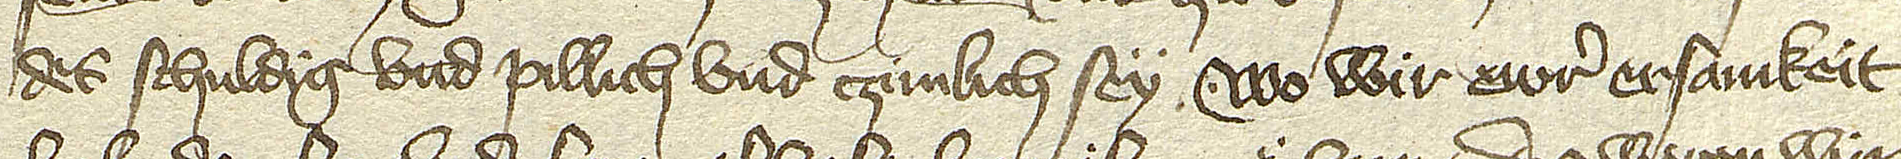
des ſchuldig vnd pillich vnd cʒimlich ſey . Wo wir ewr* erſamkeit
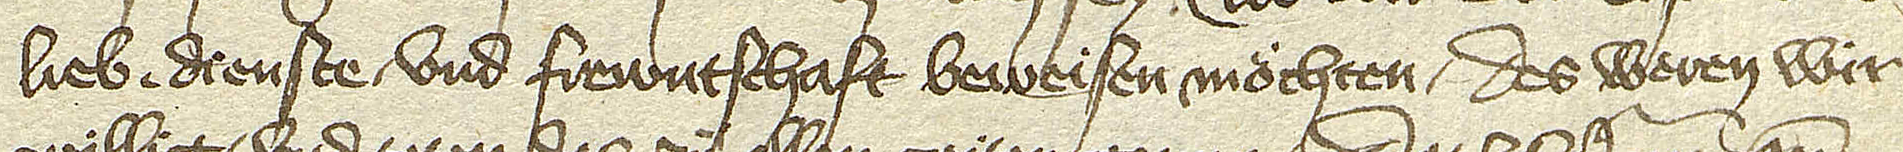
lieb / dienſte / vnd frewntſchaft beweiſen möchten / Des weren wir
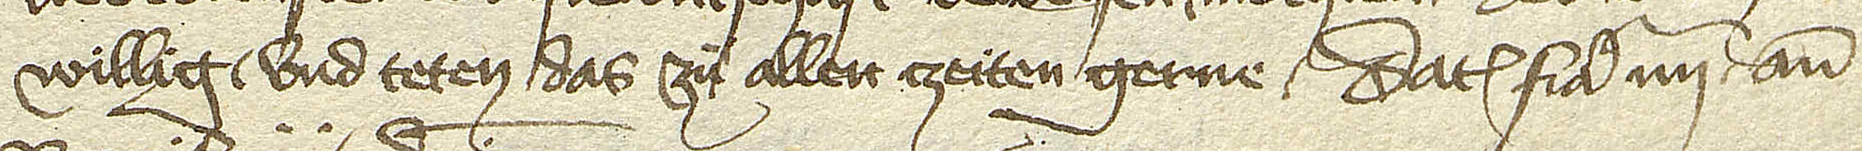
willig / vnd teten das cʒü allen cʒeiten gerne / Dat* fia* iiii* / an*
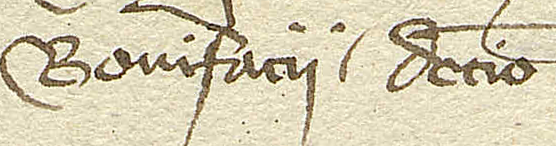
Bonifacii / decio*
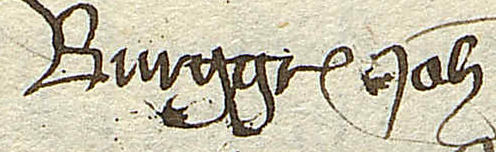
Burggr* Ioh*
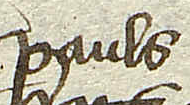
pauls
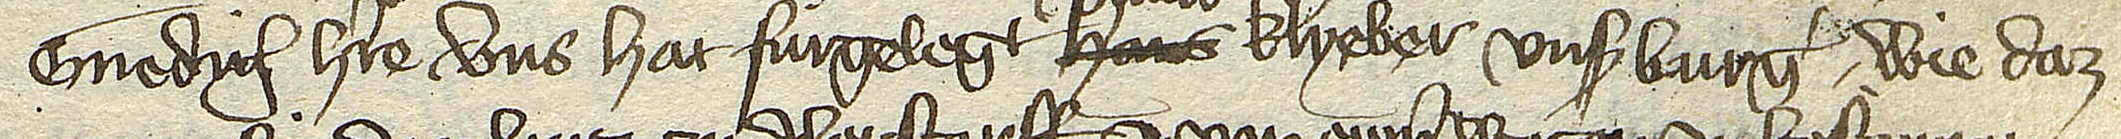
Gnedig* h*re / vns hat fürgelegt hans klyeber vnſ* burg* / wie daʒ
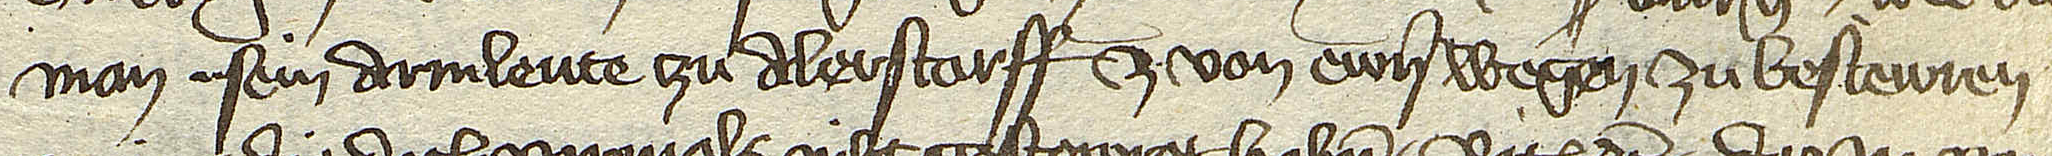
man ~ ſein Armleute cʒu Alerſtorff cʒ von ewn* wegen cʒu beſtewren
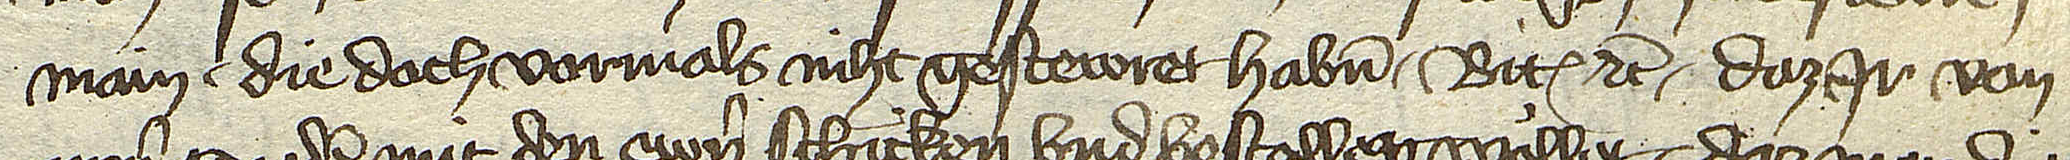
main / die doch vormals niht geſtewret habn* / Bit* ec* / daʒ Ir von
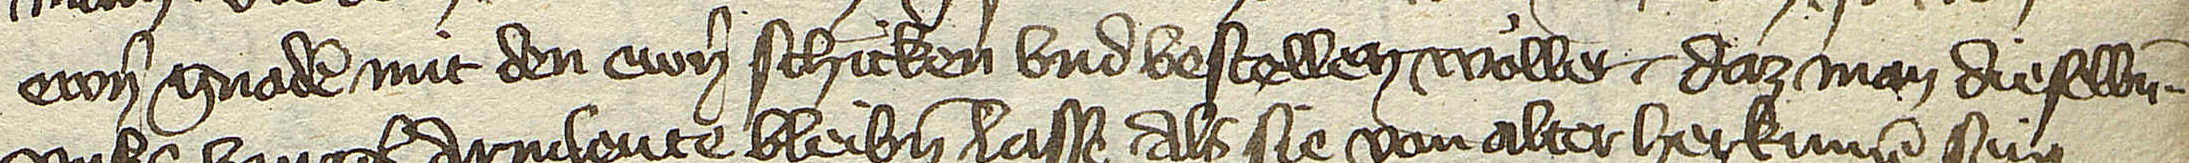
ewn* gnade* mit den ewn* ſchicken vnd beſtellen wöllet / daʒ man dieſelbn* ~
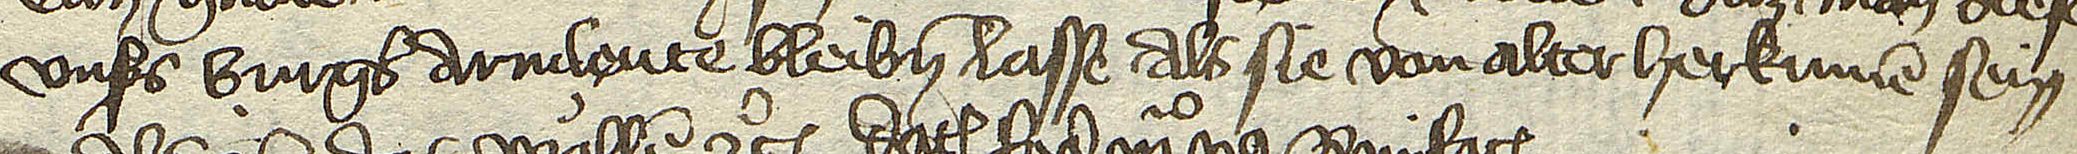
vnſ*s burg*s Armleute bleibn* laſſe / Als ſie von alter herkume* ſein
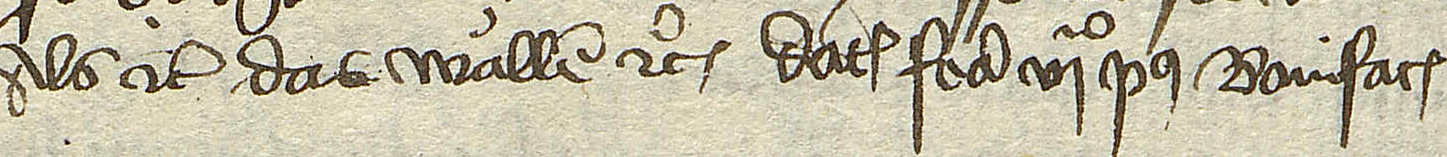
Als ec* das wölle* ec* dat* fea* vi* p* Bonifac*
